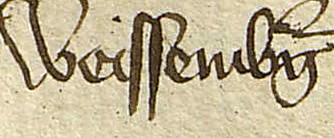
Weiſſemb*g
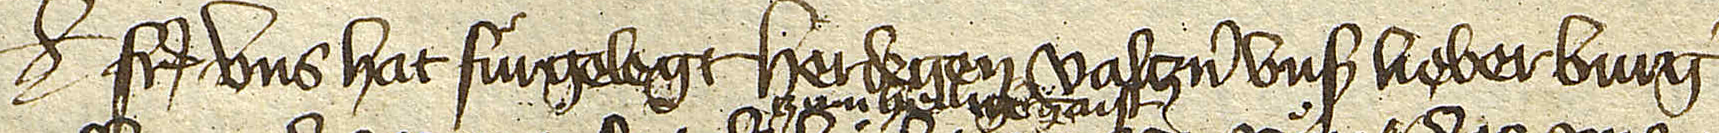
L* fr* / Vns hat fürgelegt herdegen valcʒn* vnſ* lieber burg*
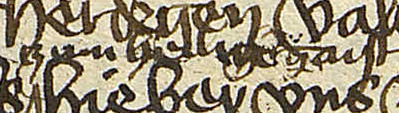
cʒum heilige* gaiſt
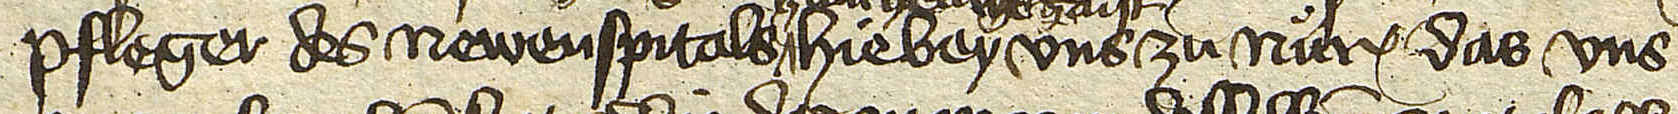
Pfleger des Newenſpitals hie bey vns cʒu Nür* / das vns
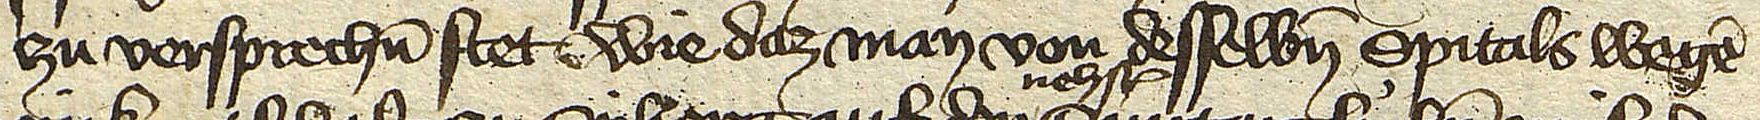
cʒu verſprechn* ſtet / wie daʒ man von deſſelbn* Spitals wege*
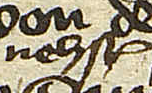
nehſt*
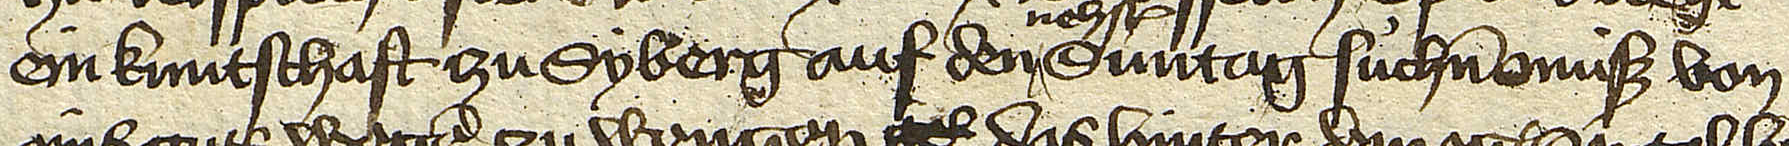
ein kuntſchaft cʒu Syberg auf den Suntag ſüchn* müſʒ von
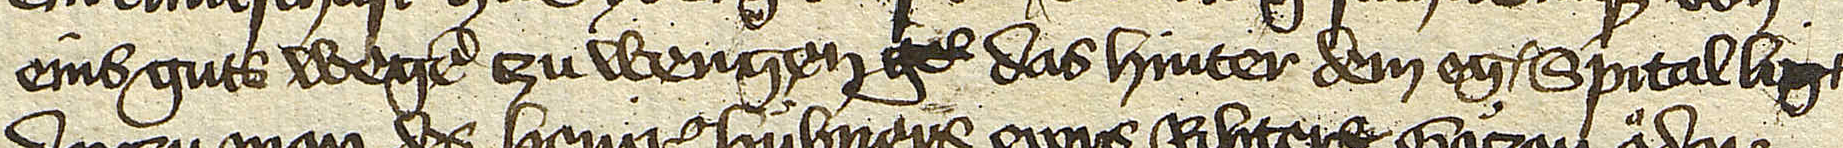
eins guts wege* cʒu Wengen gel das hinter dem eg* Spital ligt
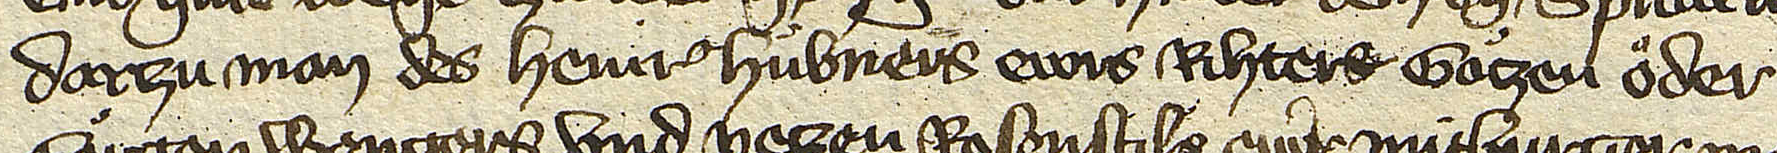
darcʒu man des heinr* hübners ewrs Rihters Göcʒen öder
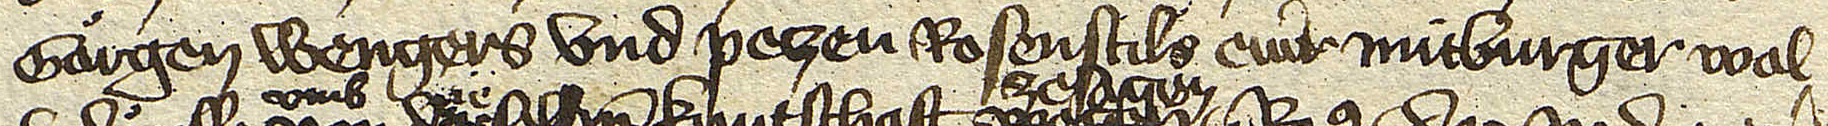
Görgen Wengers vnd pecʒen Roſenſtils ewr* mitburger wol
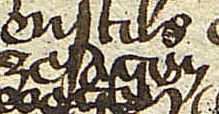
cʒeſagen
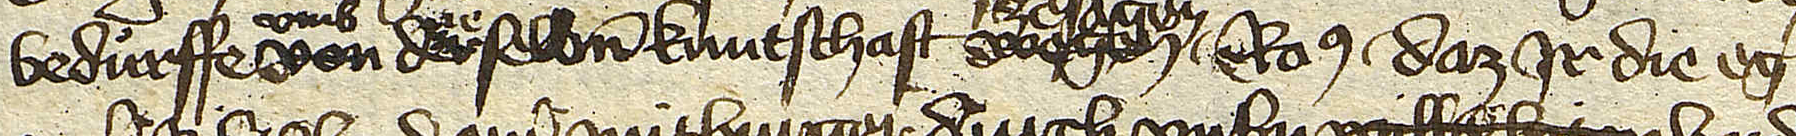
bedürffe von derſelbn* kuntſchaft wegen / Ro* / daʒ Ir die eg*
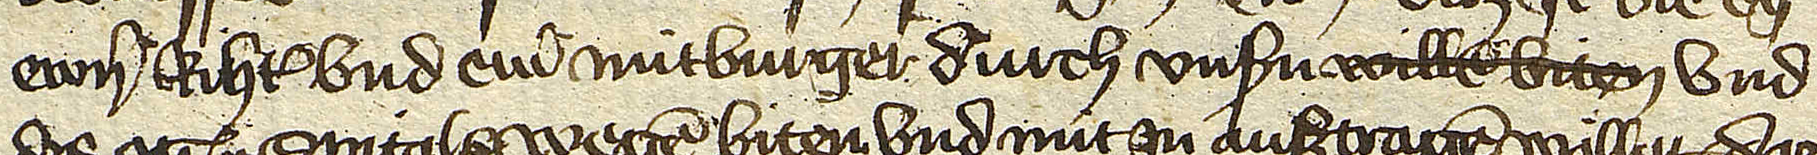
ewn* Riht* vnd ew* mitburger durch vnſ*n wille* biten vnd
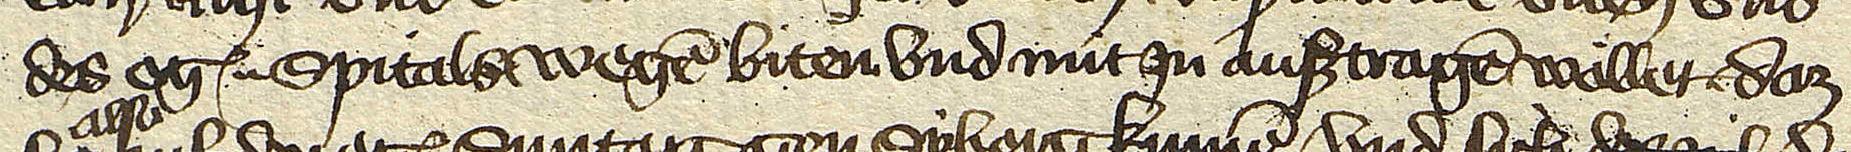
des eg*~ Spitals wege* biten vnd mit In auſʒtrage* wöllet / daʒ
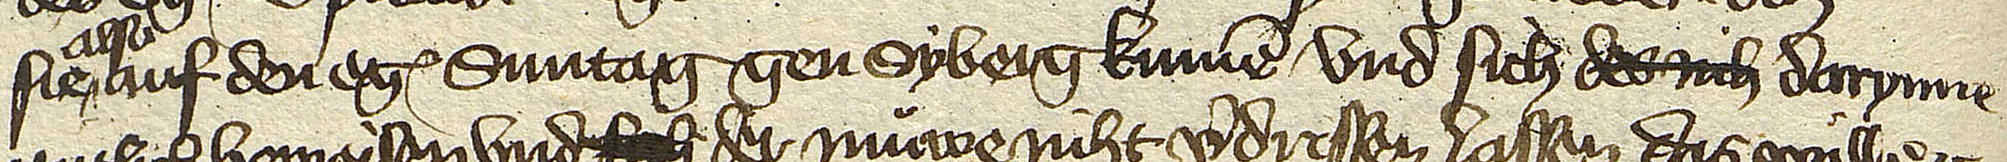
ſie auf den eg* Suntag gen Syberg kume* / vnd ſich des nih darynne
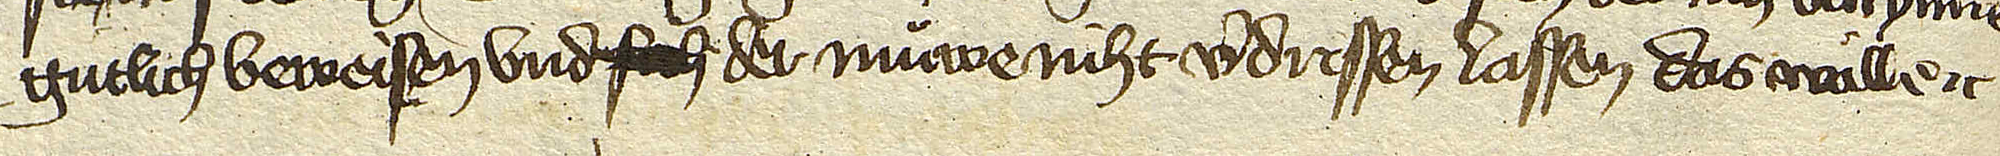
gutlich beweiſen vnd ſich der müewe niht v*driſſen laſſen das wölle* ec*
